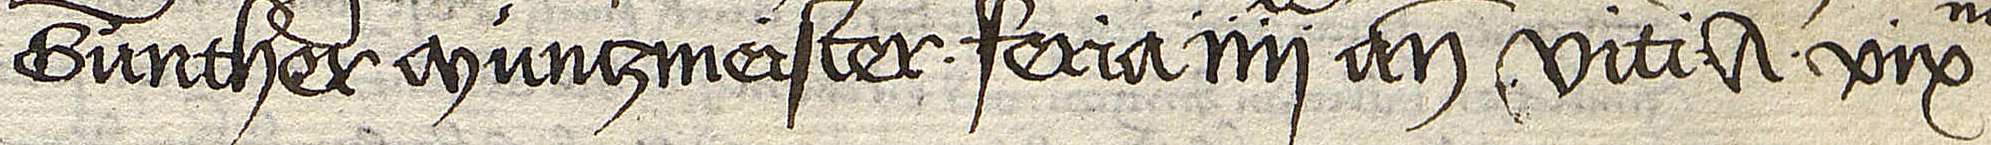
Günther Müncʒmeiſter . feria iiii* an* viti A* xix*
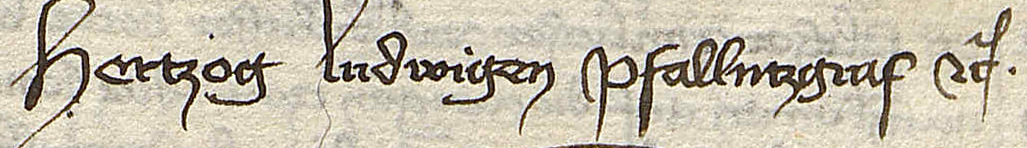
Hercʒog ludwigen pfallncʒgraf ec* .
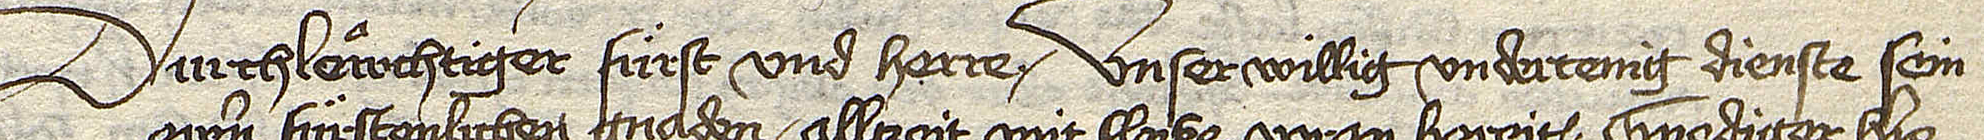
Durchlëwchtiger fürſt vnd herre / Vnſer willig vndertenig dienſte ſein
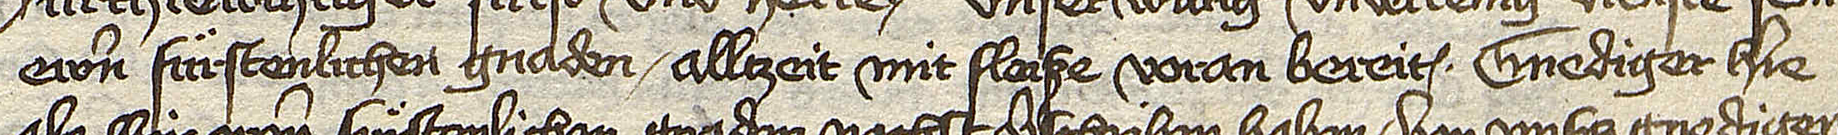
ew*n fürſtenlichen gnaden / allcʒeit mit fleiſʒe voran bereit* . Gnediger h*re
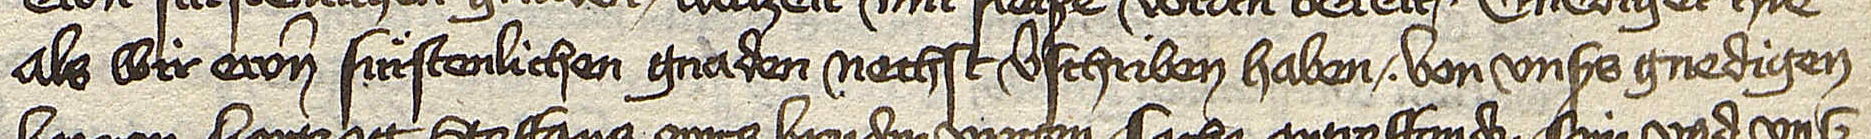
als wir ew*n fürſtenlichen gnaden nehſt v*ſchriben haben / . von vnſ*s gnedigen
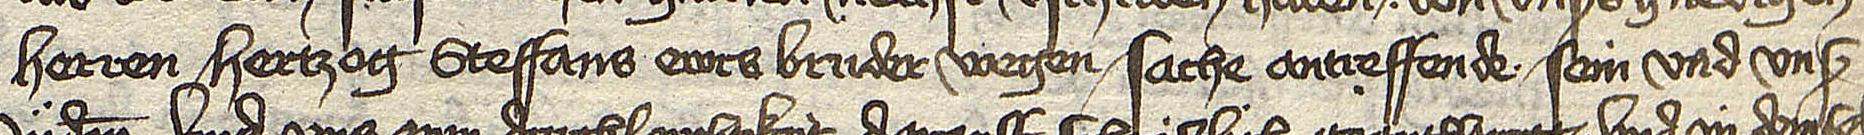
herren / hercʒog Steffans ewrs bruder wegen / ſache antreffende . / ſein vnd vnſ*
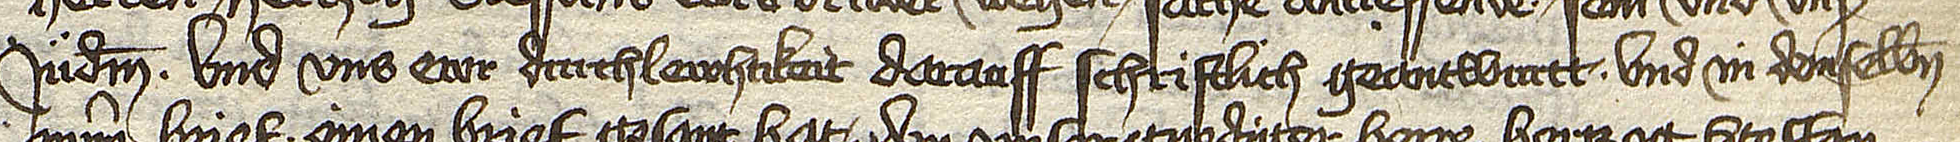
Iüdin* . Vnd vns ewr durchlewhtikeit darauff ſchriftlich geantwurtt . Vnd in demſelbn*
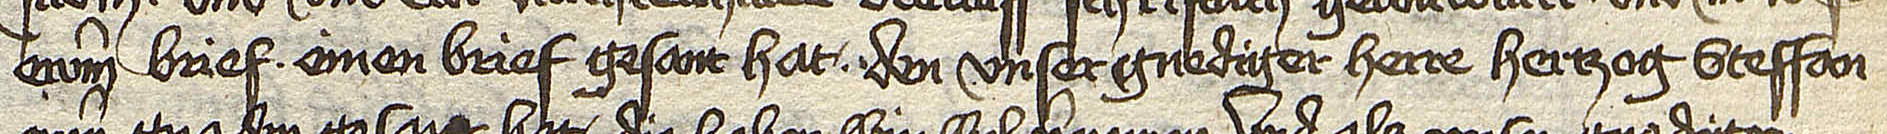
ew*m brief . einen brief geſant hat . den vnſer gnediger herre hercʒog Steffan
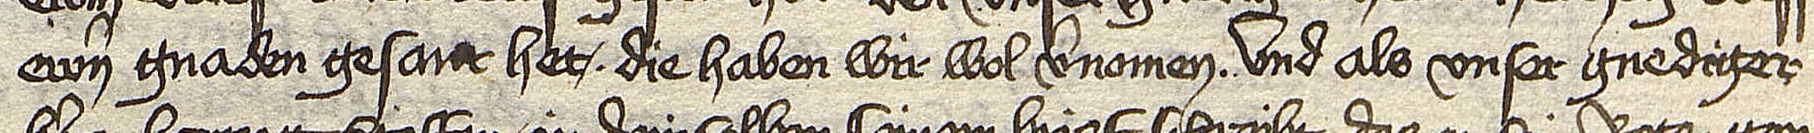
ew*n gnaden geſant het / . die haben wir wol v*nomen . Vnd als vnſer gnediger
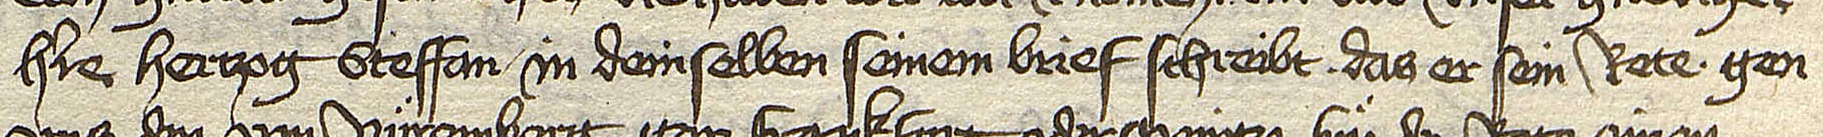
h*re hercʒog Steffan / in demſelben ſeinem brief ſchreibt . das er ſein Rete . gen
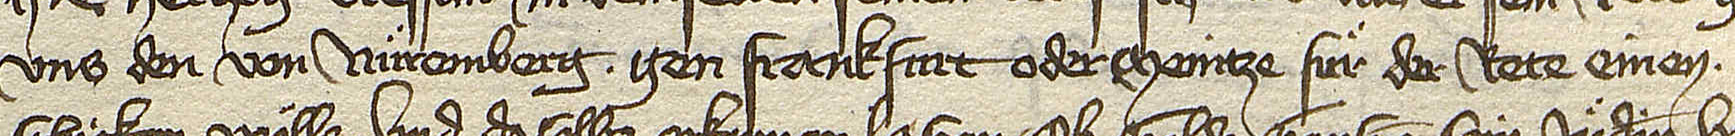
vns den von Nüremberg . gen frankfurt oder Meincʒe für der Rete einen .
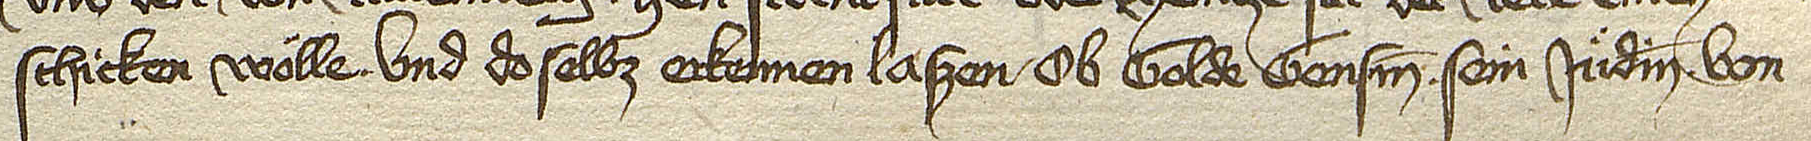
ſchicken wölle . Vnd doſelbʒ erkennen laſʒen / Ob Golde Genſin* . ſein Iüdin* . von
